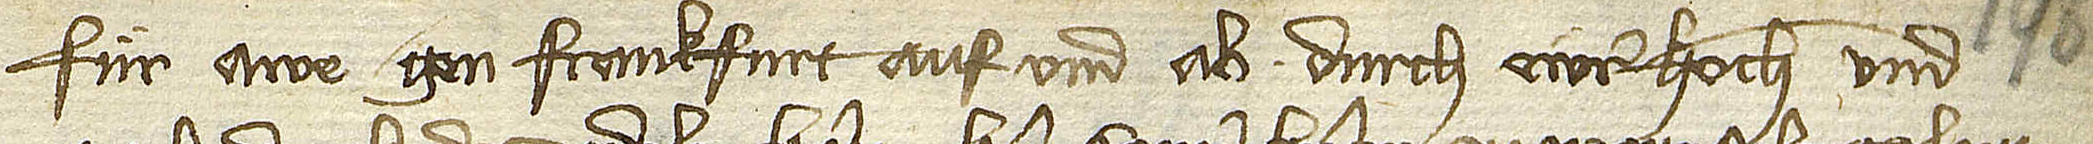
für awe / gen Frankfurt auf vnd ab . durch ew*r hoch* vnd
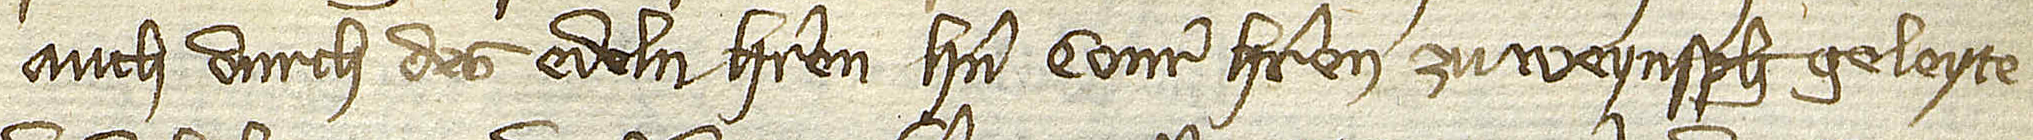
auch durch des edeln h*ren h*n Conr* h*ren ʒu weynſp*g geleyte
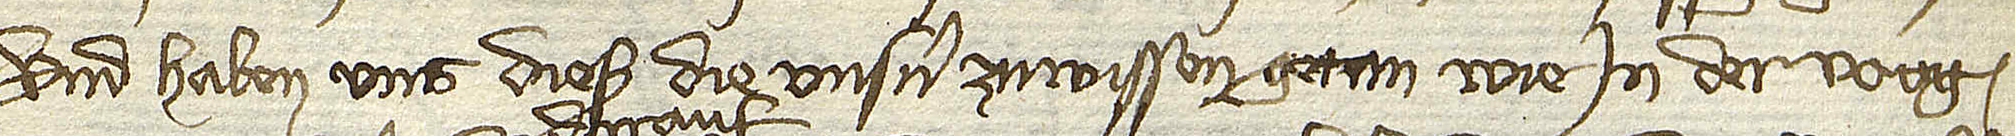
Vnd haben vns dieſ* die vnſ*n ʒuwiſſen getan wie In der vorg*
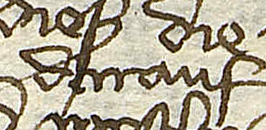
darauf
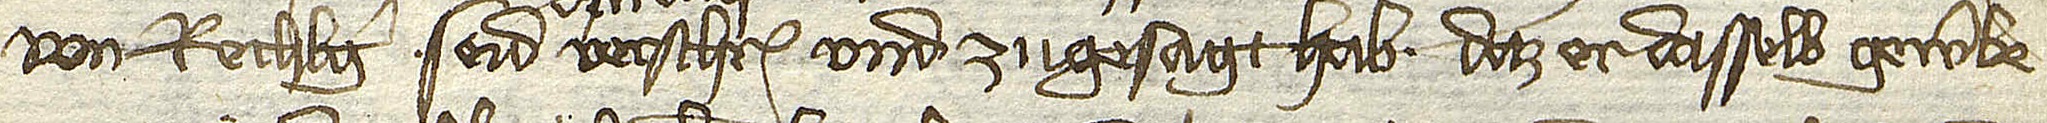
von Rechb*g . ſeid verſchr* vnd ʒugeſagt hab . daʒ er daſſelb gew*be
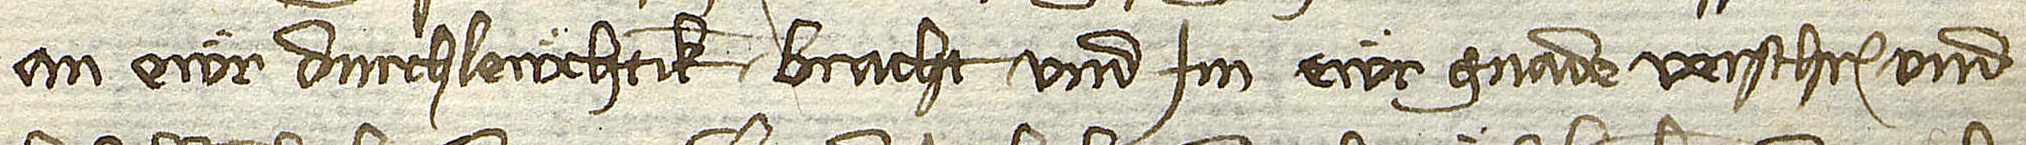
an ewr durchlewchtik* / bracht vnd Im ewr gnade verſchr* vnd
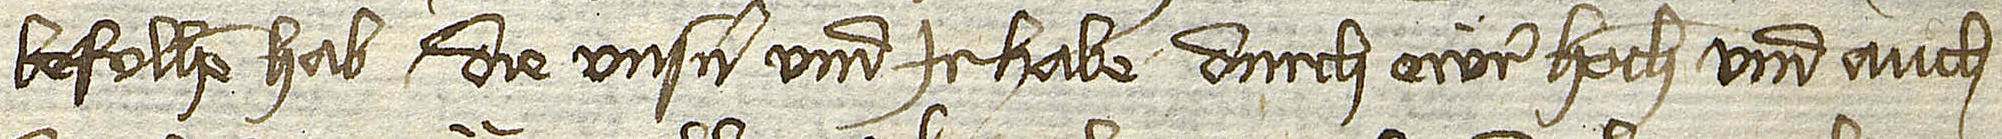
befolhe* hab / die vnſ*n vnd Ir habe / durch ew*r hoch* vnd auch
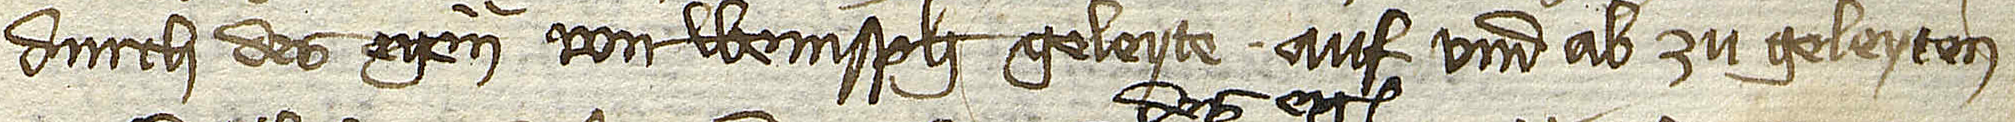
durch des egen* von weinſp*g geleyte . auf vnd ab ʒu geleyten
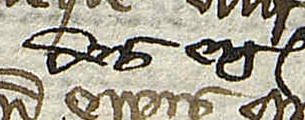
des eg*
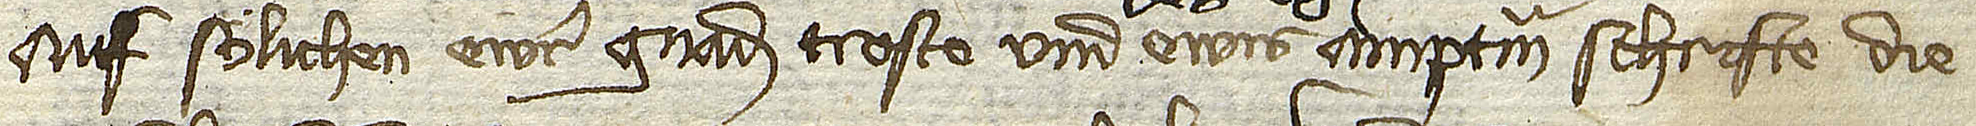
auf ſölichen ew*r gnad* troſte vnd ewrs amptm* ſchrifte die
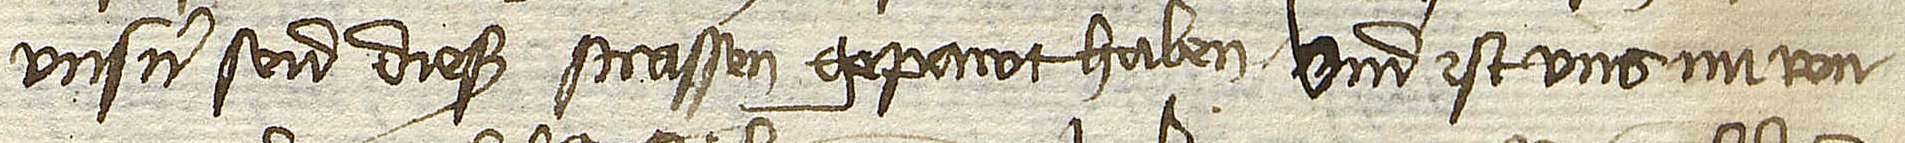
vnſ*n ſeid dieſ* ſtraſſen gepawt haben / Vnd iſt vns nu von
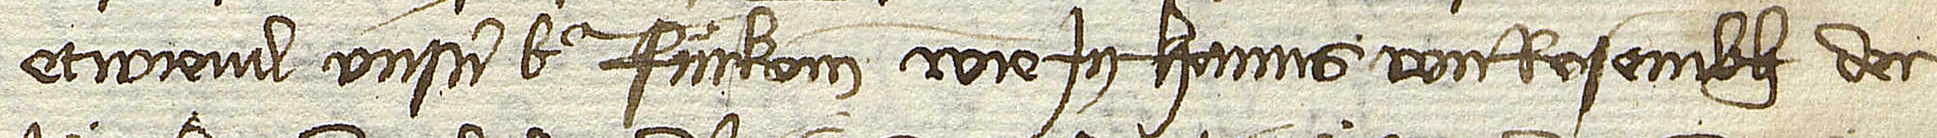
etwieuil vnſ*n b* fürkom* . wie In hanns von Roſemb*g der
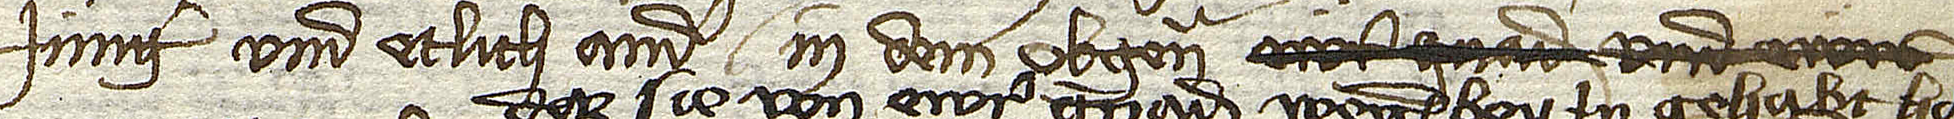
Iüng* vnd etlich and* / in dem obgen* ew*r gnad* vnd ewrs
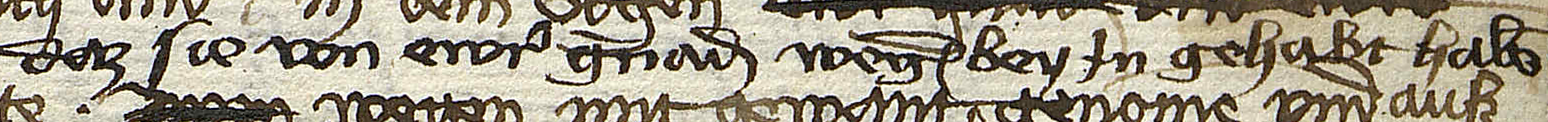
daʒ ſie von ew*r gnad* weg* bey In gehabt habe*
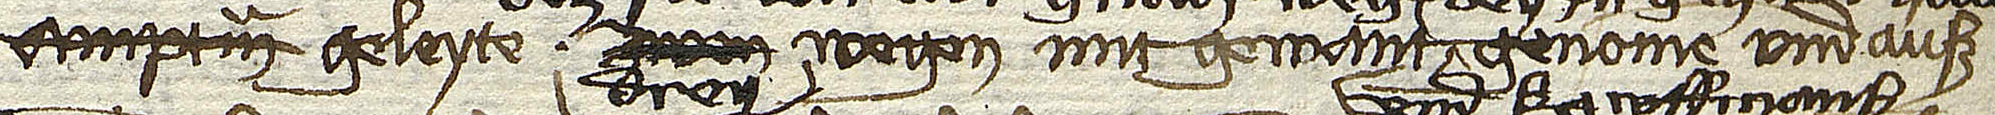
amptm* geleyte . ʒwen wegen mit gewant genome* vnd auſʒ
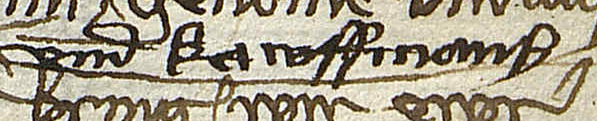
vnd kawffmanſ*
